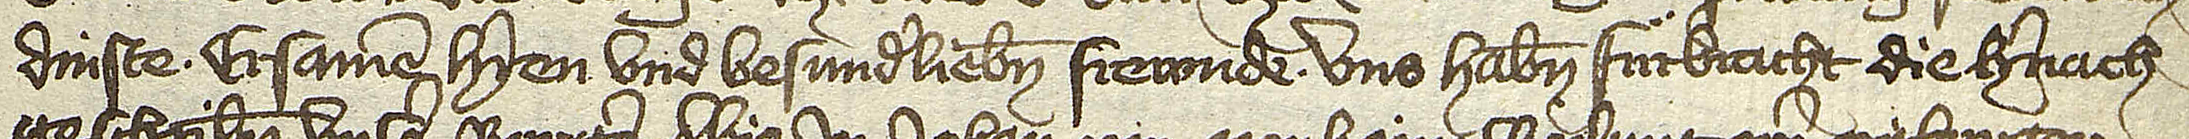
dinſte . Erſame* h*rren vnd beſund* liebn* frewnde . Vns habn* fürbracht die h*nach
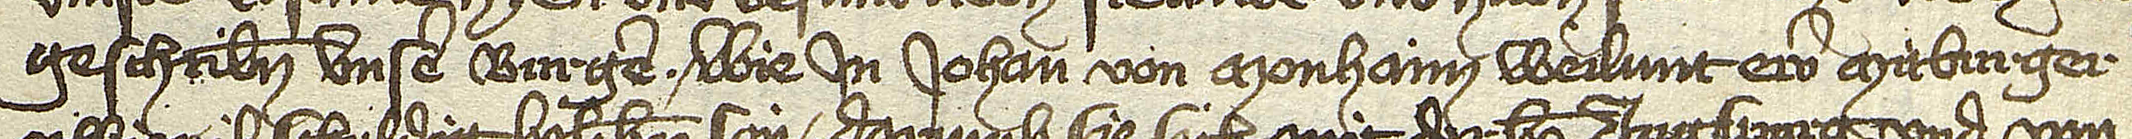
geſchribn* vnſe* Burge* . wie In Iohan von Monhaim weilunt ew* Mitburger
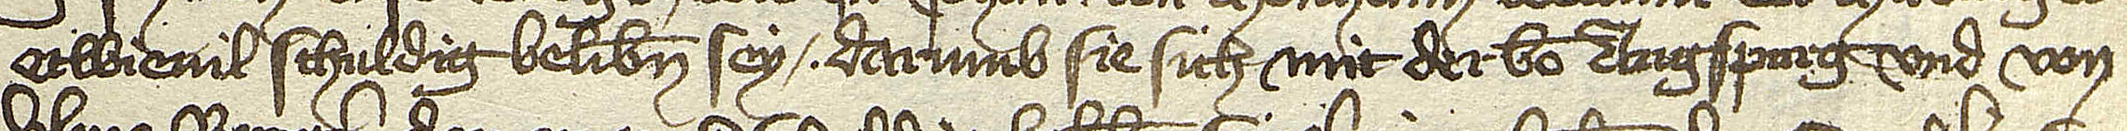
etwieuil ſchuldig belibn* ſey / . darumb ſie ſich mit der vo* Augſpurg vnd von
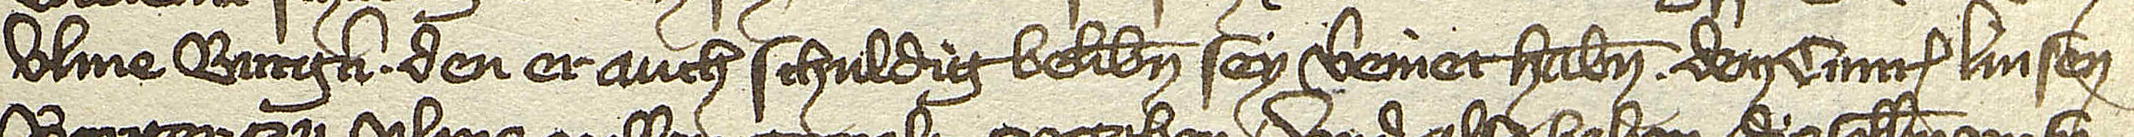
Vlme Burg*n . den er auch ſchuldig belibn* ſey v*einer habn* . den Cunr* linſen
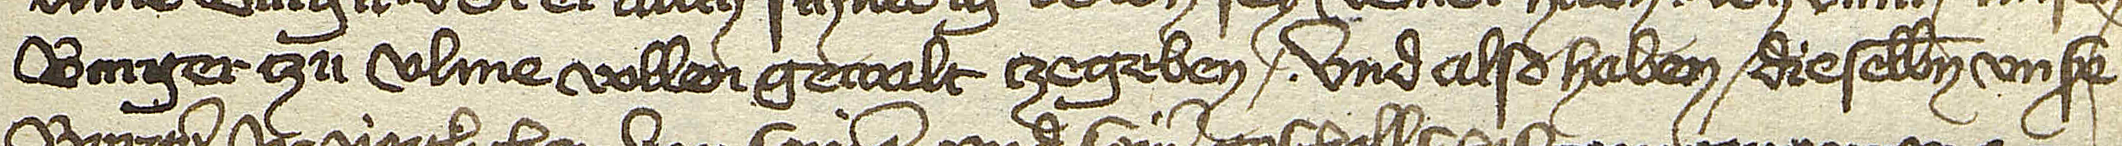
Burger cʒu vlme vollen gewalt cʒegeben / . Vnd alſo haben / dieſelbn* vnſ*e
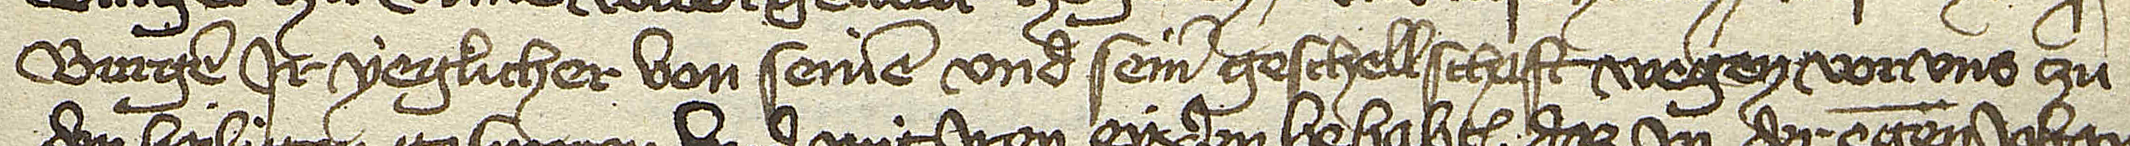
Burge* Ir yeglicher von ſeine* vnd ſein* geſchellſchaft wegen vor vns cʒu
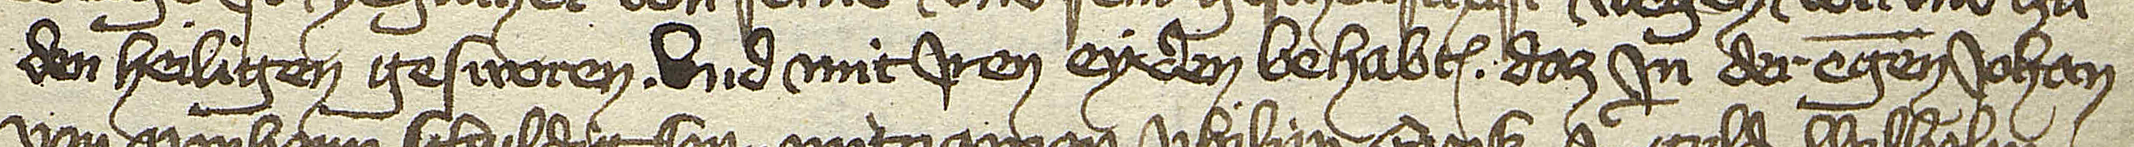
den heiligen geſworen . vnd mit Iren eyden behabt* . daʒ In der egen* Iohan
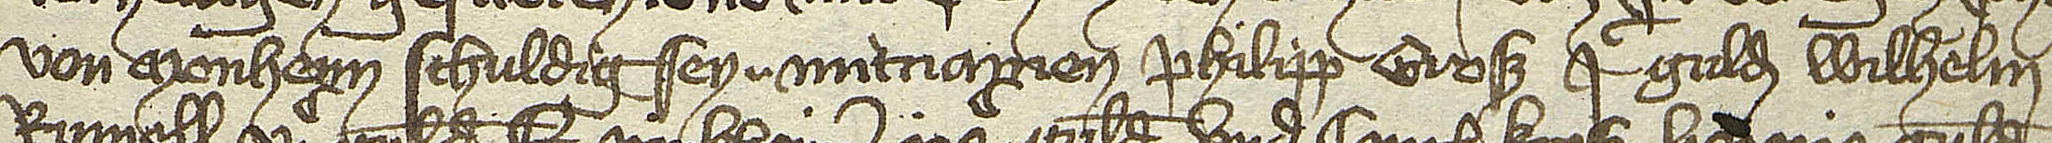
von Monheim ſchuldig ſey ~ mitnamen Philipp Groſʒ i* guld wilhelm
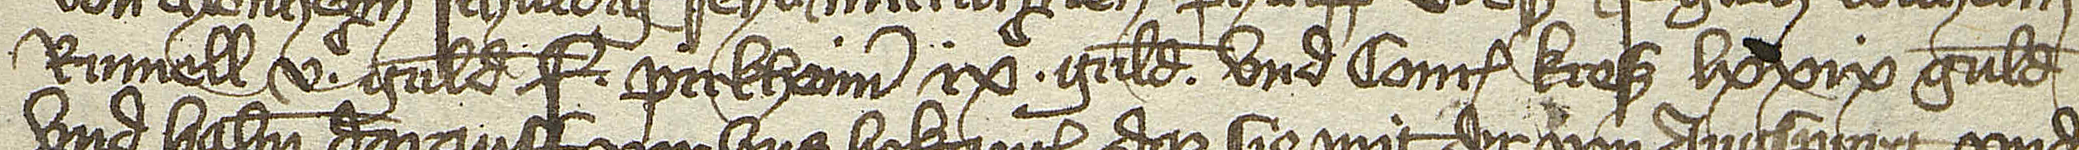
Rumell v* guld* f . pirkheim* ix* . guld*. vnd Conr* Kreſʒ lxxix guld*
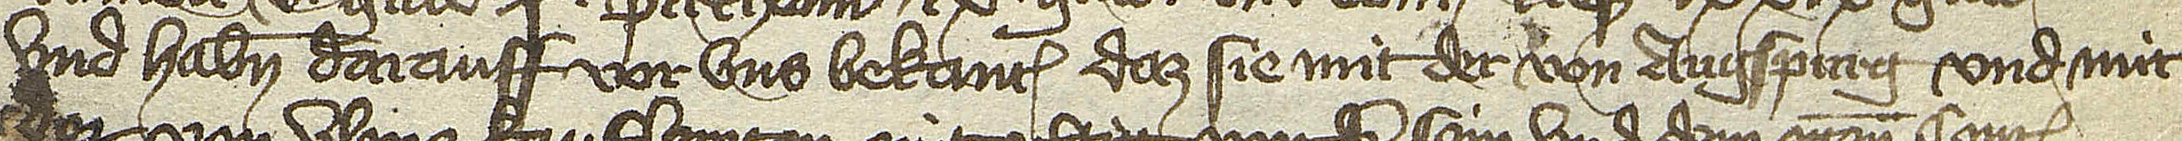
vnd habn* darauff vor vns bekant* daʒ ſie mit der von Augſpurg vnd mit
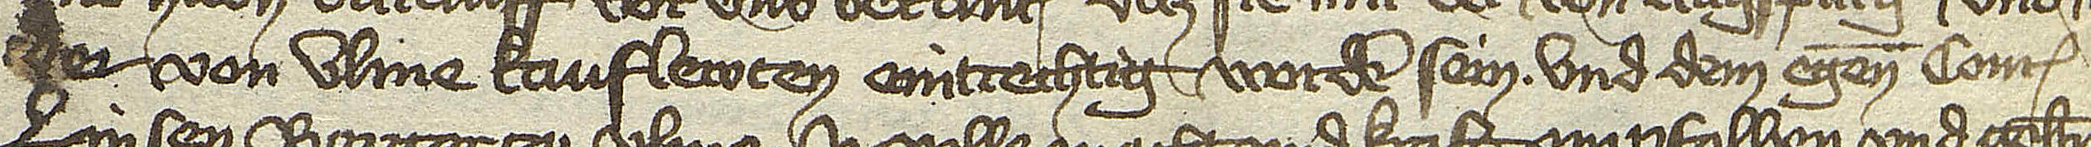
der von Vlme kauflewten eintrechtig worde* ſein . vnd dem egen* Conr*
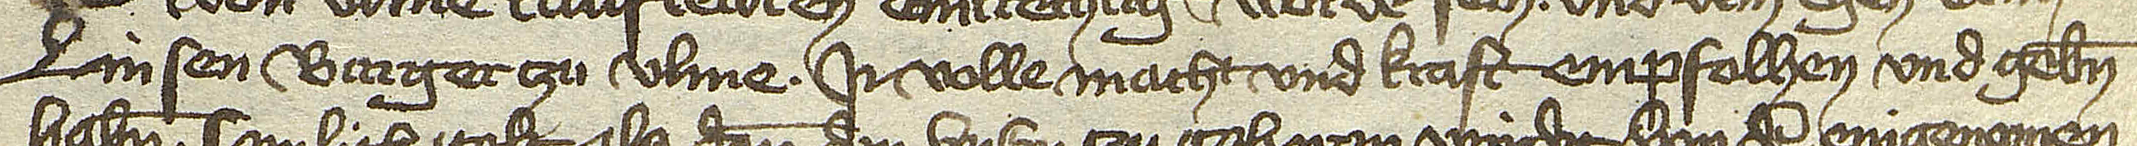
Linſen Burger cʒu vlme . Ir volle macht vnd kraft empfolhen vnd gebn*
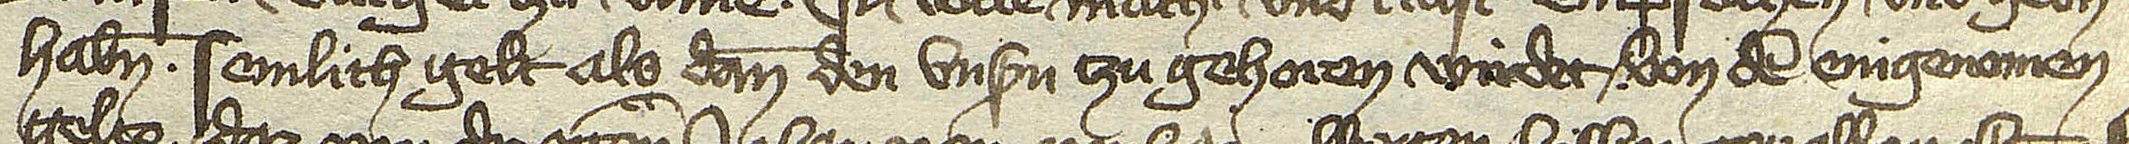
habn* . ſeinlich gelt als dan* den vnſ*n cʒu gehoren wirdet / von de* eingenomen
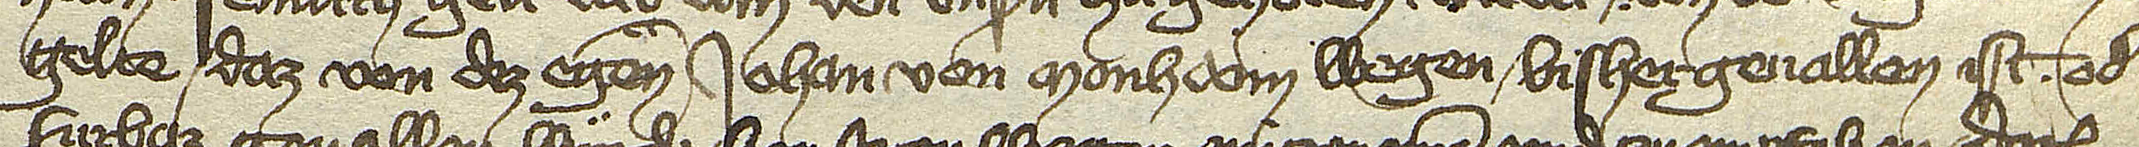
gelte / daʒ von deʒ egen* Iohan von Monhaim wegen / biſher geuallen iſt . od*
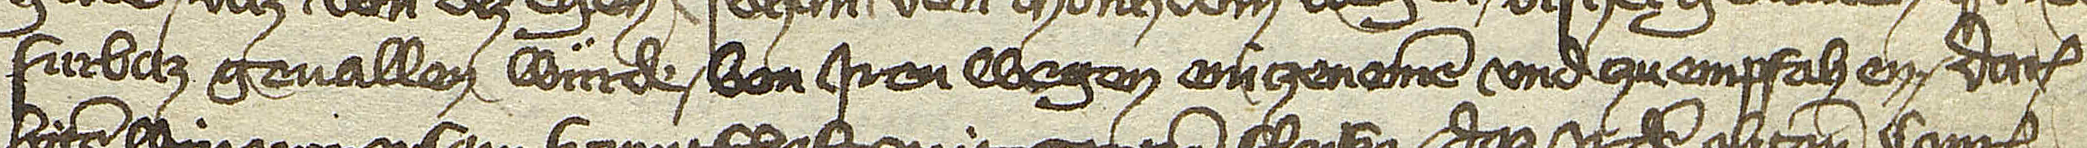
furbaʒ geuallen würde / von Iren wegen eincʒeneme* vnd cʒu empfahen / dar*
